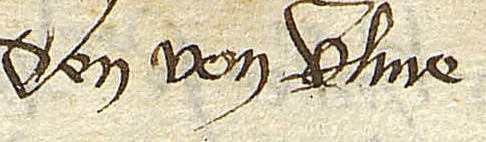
Den von Vlme
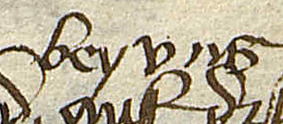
bey vns
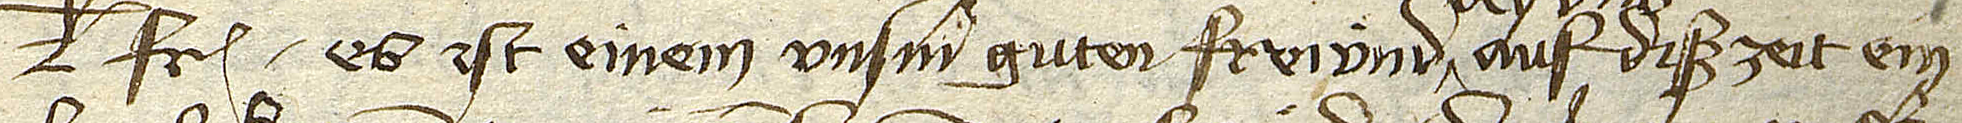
L* fr* / es iſt einem vnſm* guten frewnd auf diſ* ʒeit ein
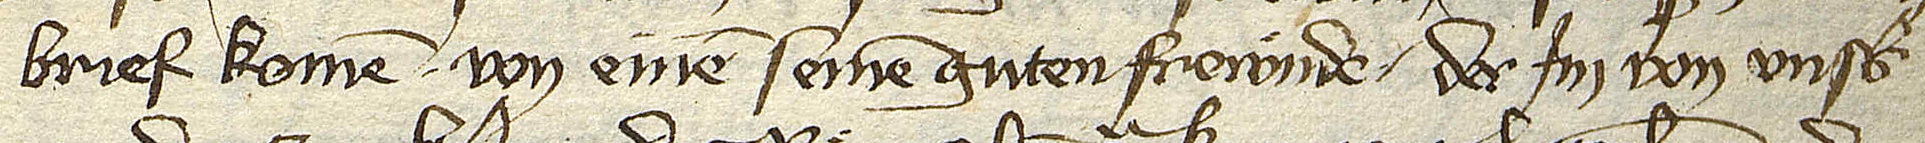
brief kome* . von eine* ſeine* guten frewnde / der Im von vnſs*
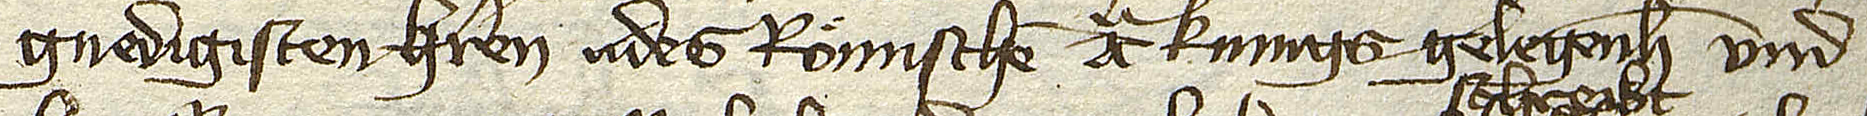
gnedigiſten hr*en ~ des Römiſche* ec* kunigs gelegenh* vnd
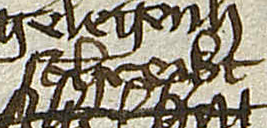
ſchreibt
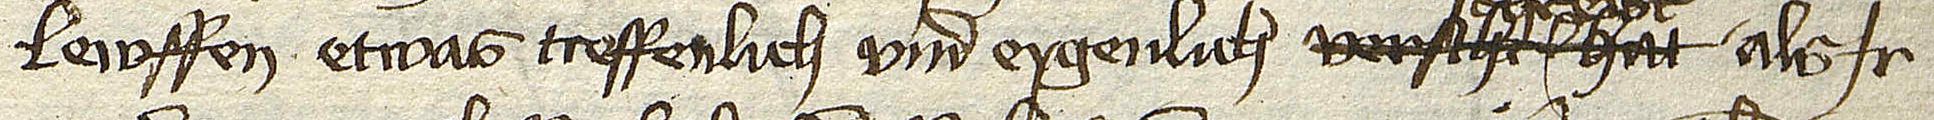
lewffen etwas treffenlich vnd eygenlich verſchr* hat / als Ir
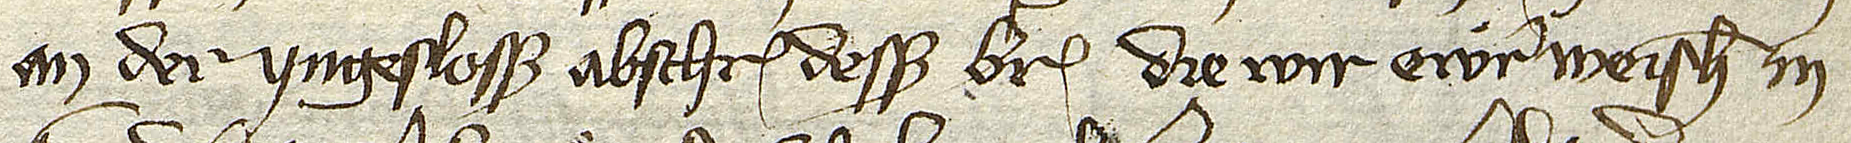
an der ~ Yngeſloſſ* abſchr* deſſ* br* die wir ewr* weiſh* in
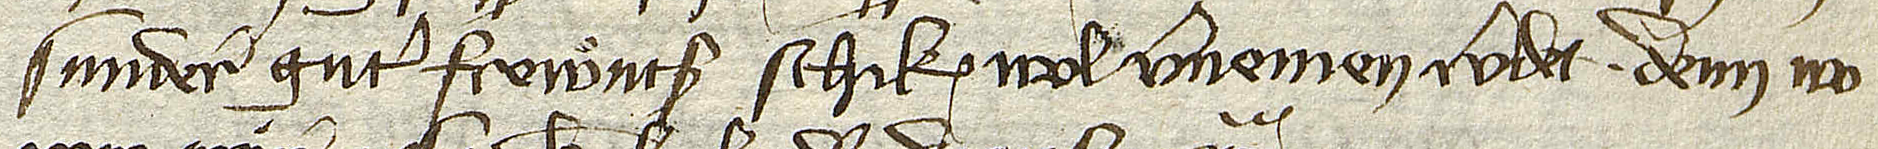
ſunder* gut* frewntſ* ſchik* wol v*nemen w*dt ~ Denn wo
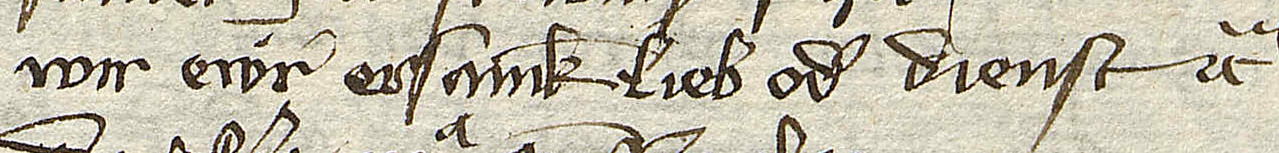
wir ewr* erſamk* lieb od* dienſt ec*
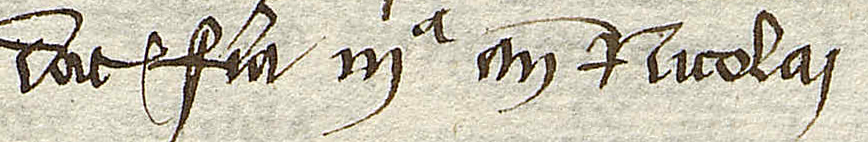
Dat* fi*a iii* an* Nicolai
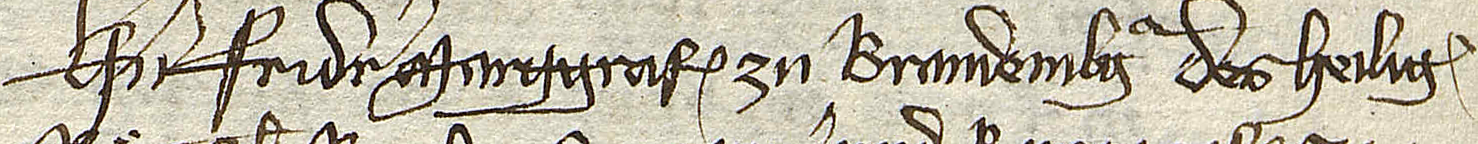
Hn* Fridr* Marggraf* ʒu Brandembg* des heilig*
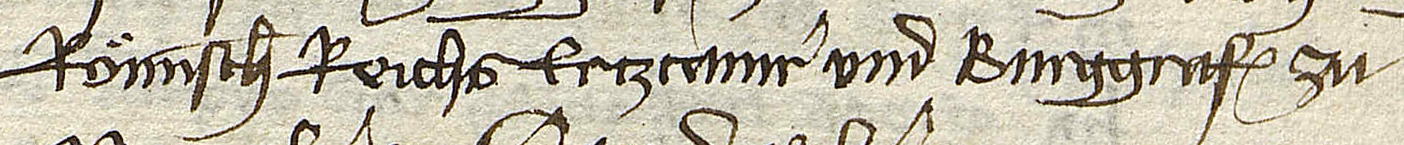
Römiſch* Reichs Ercʒcamr* vnd Burggraf* cʒu
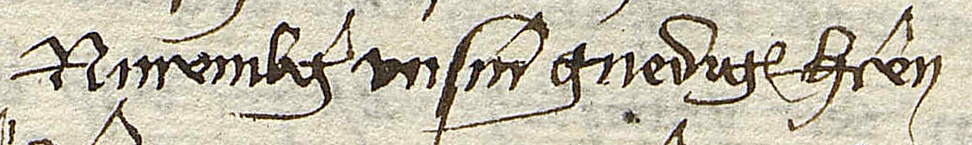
Nurembg* vnſm* gnedig* hr*en
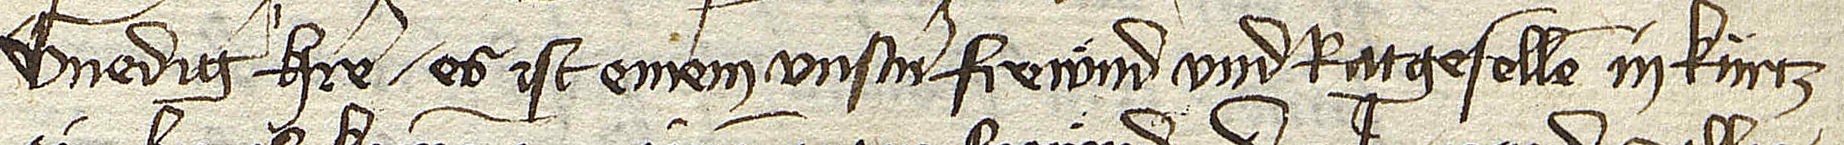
Gnedig* Hre* / es iſt einem vnſm* frewnd vnd Ratgeſelle* in kürcʒ
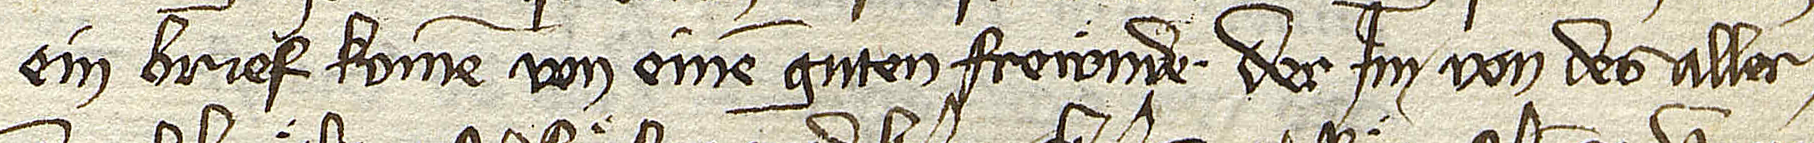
ein brief kome* von eine* guten frewnde . Der Im von des aller
